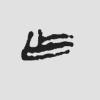乍
